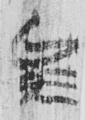矣
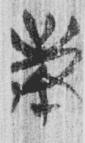庚（康）
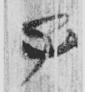子
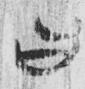曰
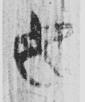母
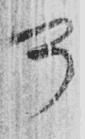乃
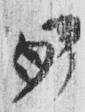肥
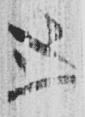之
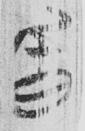昏
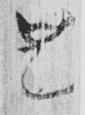也
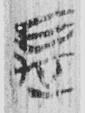是
